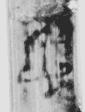{矛心}
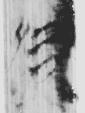於
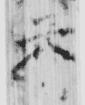亓
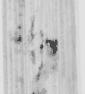力
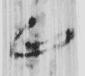㠯（以）
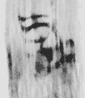求
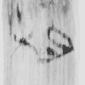相
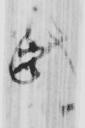臤
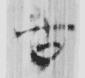古
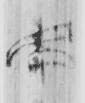民
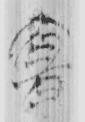宜
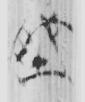地
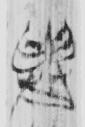𪴿
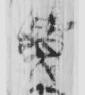{貝爲}
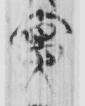實
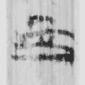正
